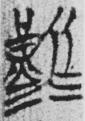○（漸）
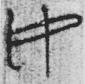女
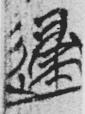○（歸）
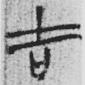吉
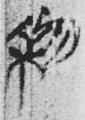利
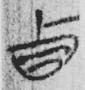貞
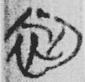初
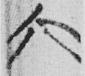六
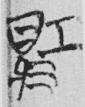○（鴻）
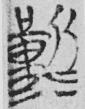○（漸）
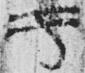于
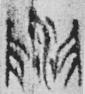○（澗）
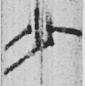少（小）
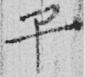子
